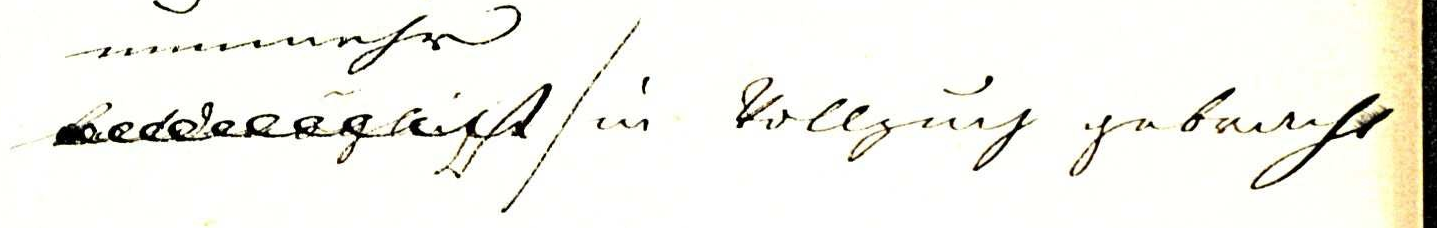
in Vollzug gebracht
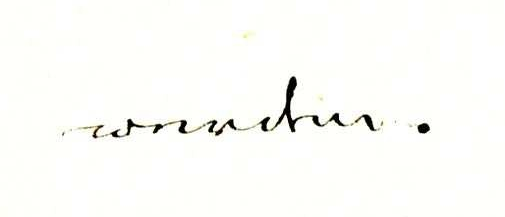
werden.
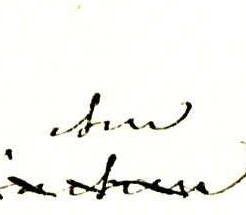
den
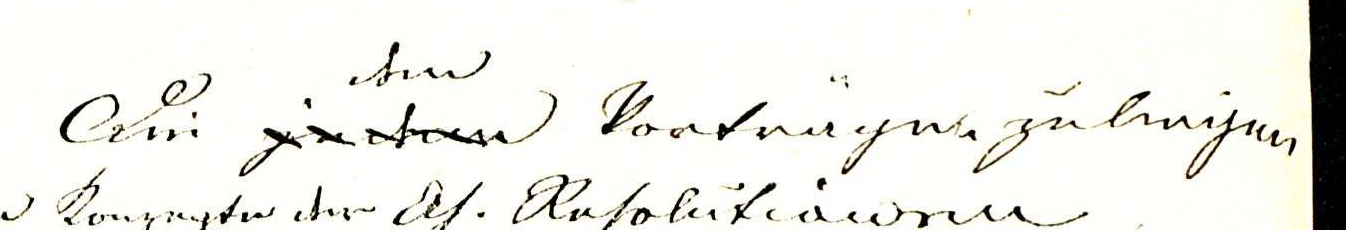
Die Vorträge zu bringen
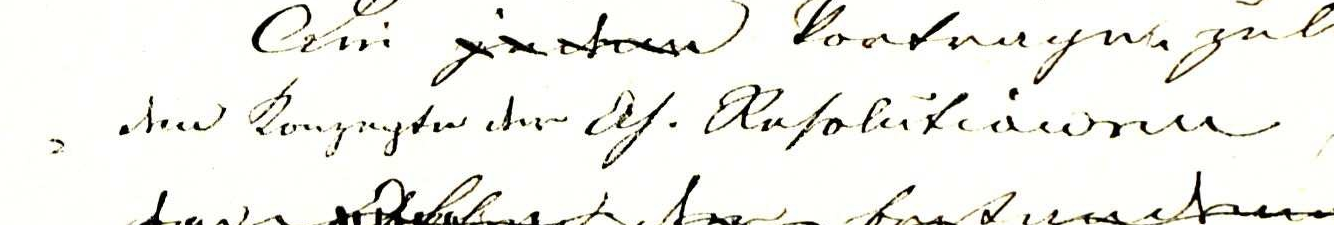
den Konzepten der Ah Resolutionen
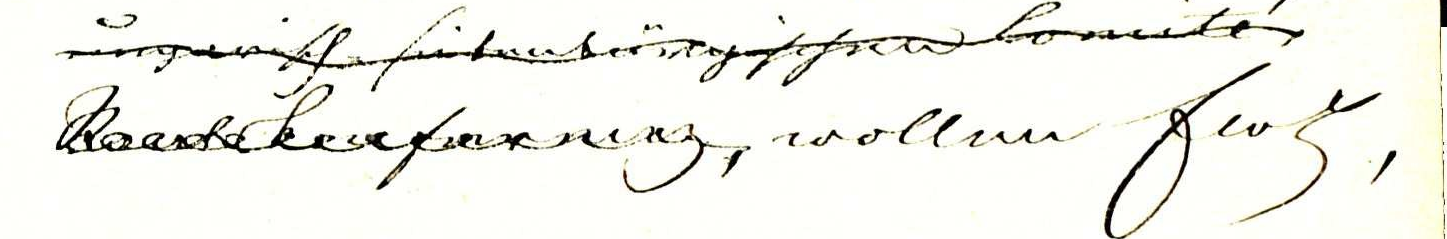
wollen EwH
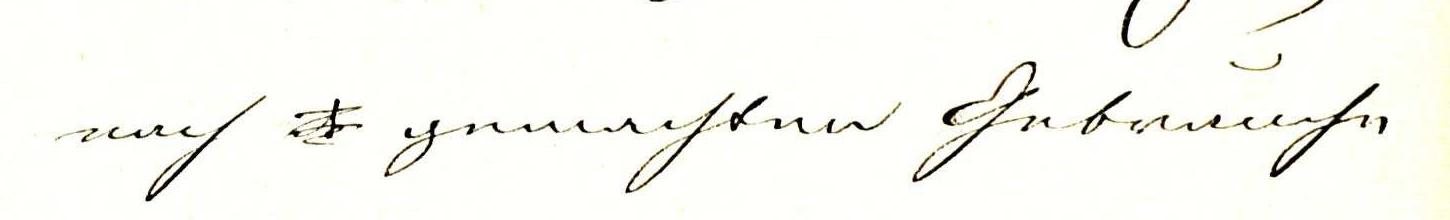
nach gemachten Gebrauche
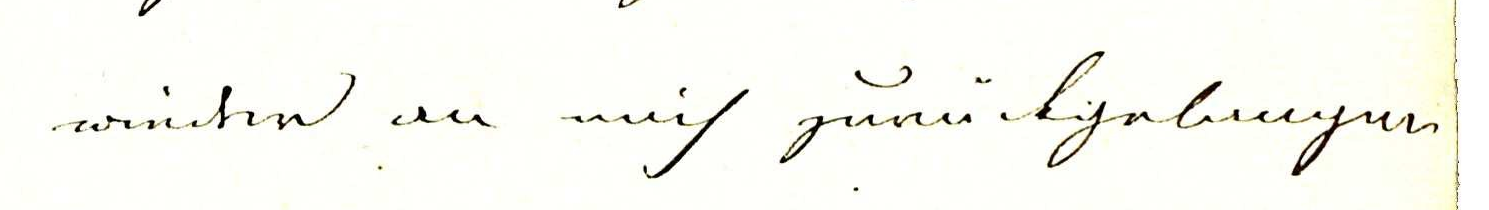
wieder an mich zurückzelangen
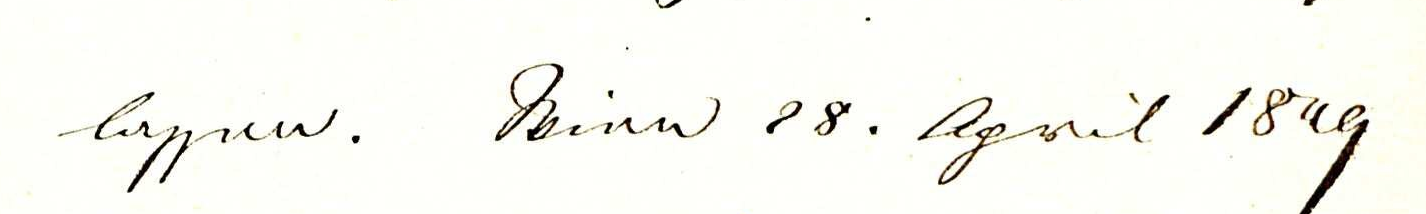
lassen. Wien 28. April 1849
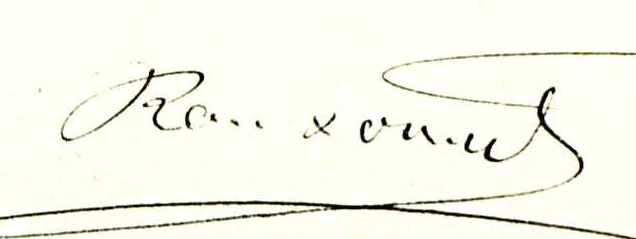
Ransonnet
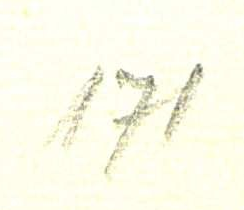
171
